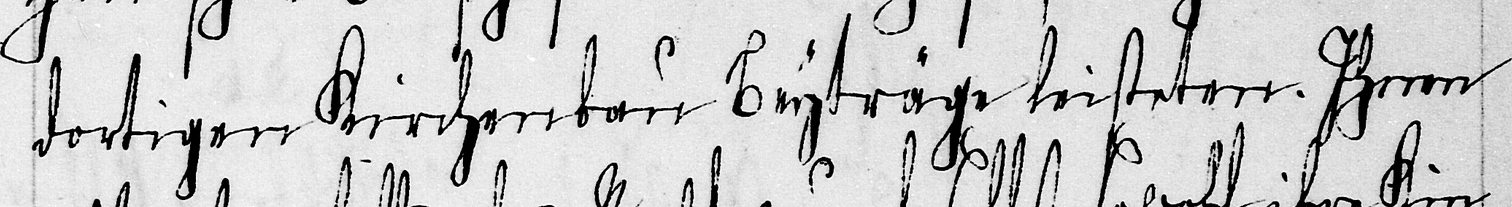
dortigen Kirchenbau Beyträge leisteten. Ihnen
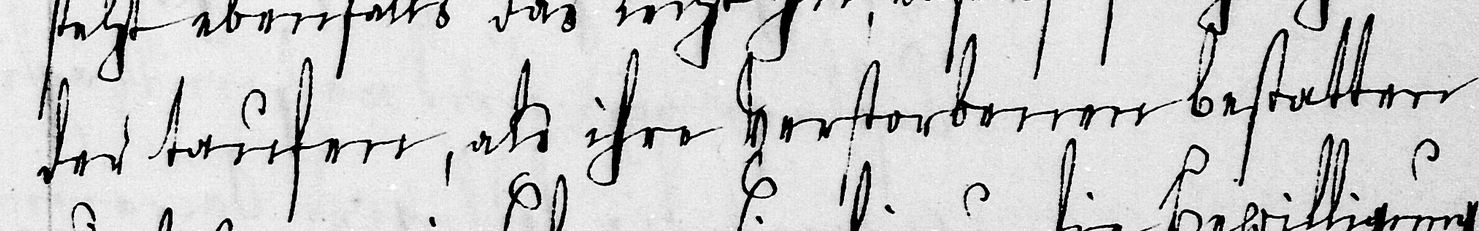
der taufen, als ihre Verstorbenen bestatten
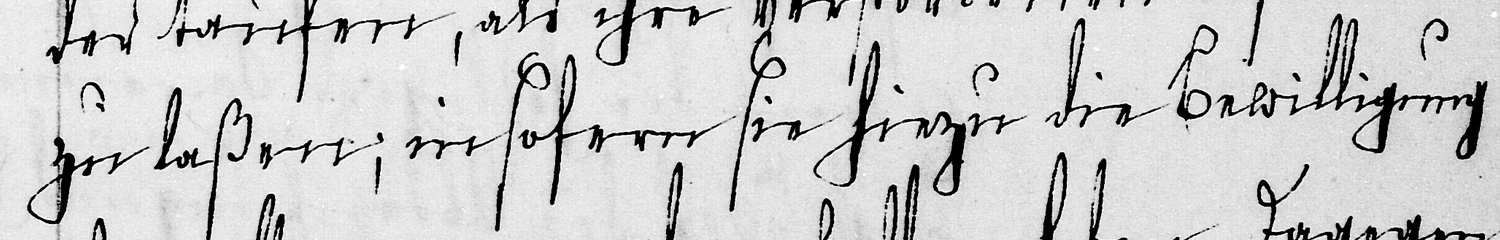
zu laßen; insofern sie hiezu die Bewilligung
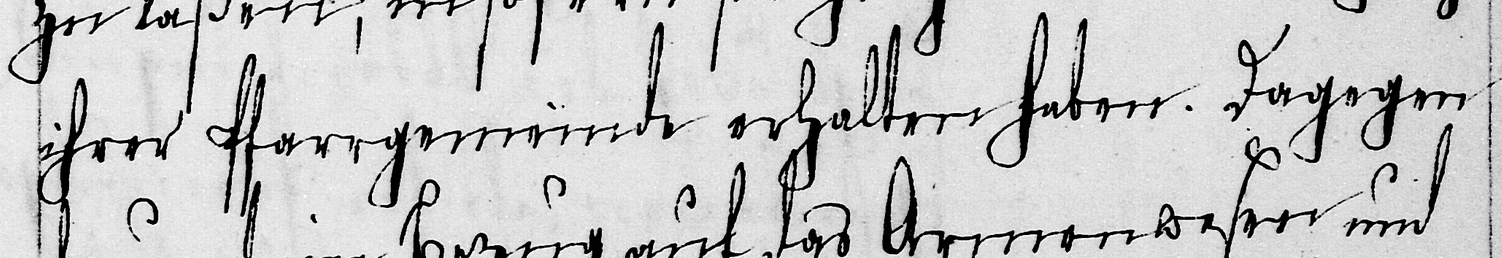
ihrer Pfarrgemeinde erhalten haben. Dagegen
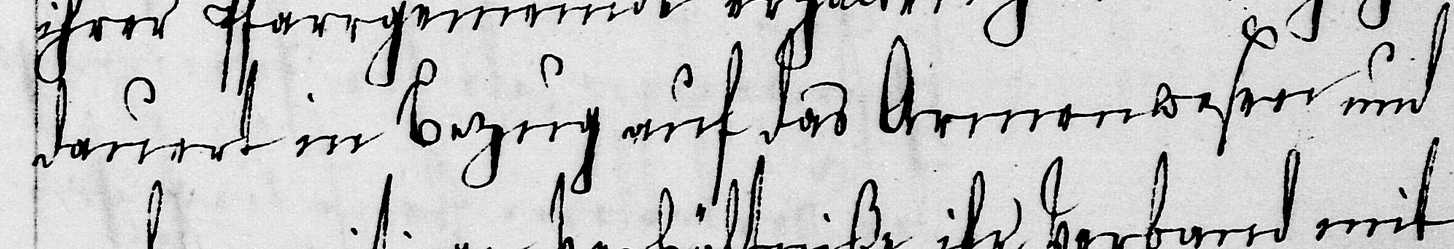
dauert in Bezug auf das Armenwesen und
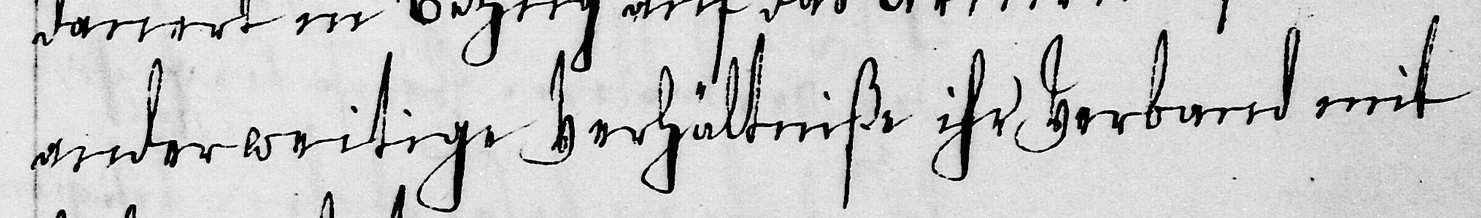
anderweitige Verhältniße ihr Verband mit
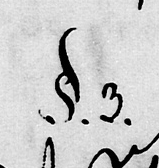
§. 3.
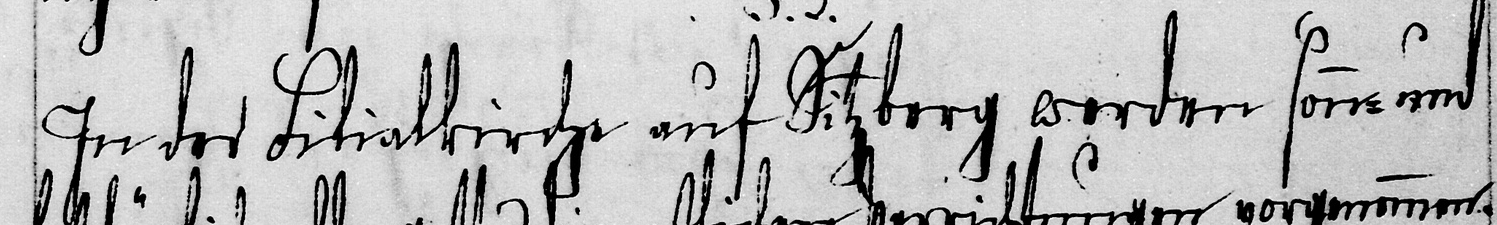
In der Filialkirche auf Sitzberg werden sonn-
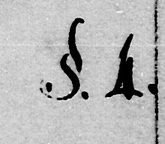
n.
